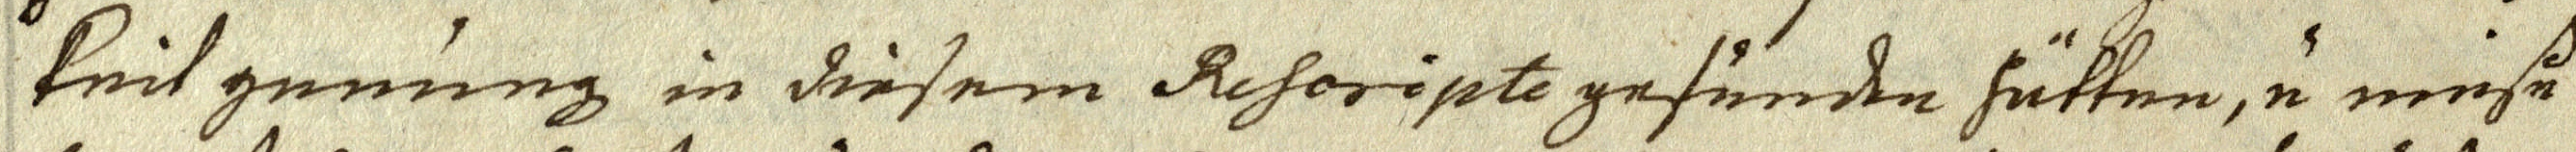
keit genung in diesem Rescripte gefunden hätten, u müße
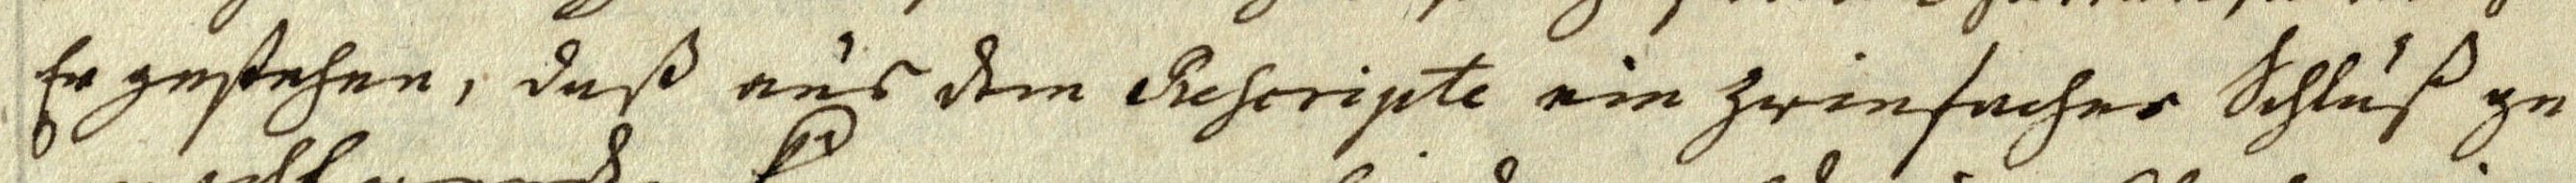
Er gestehen, daß aus dem Rescripte ein zweifacher Schluß ge¬
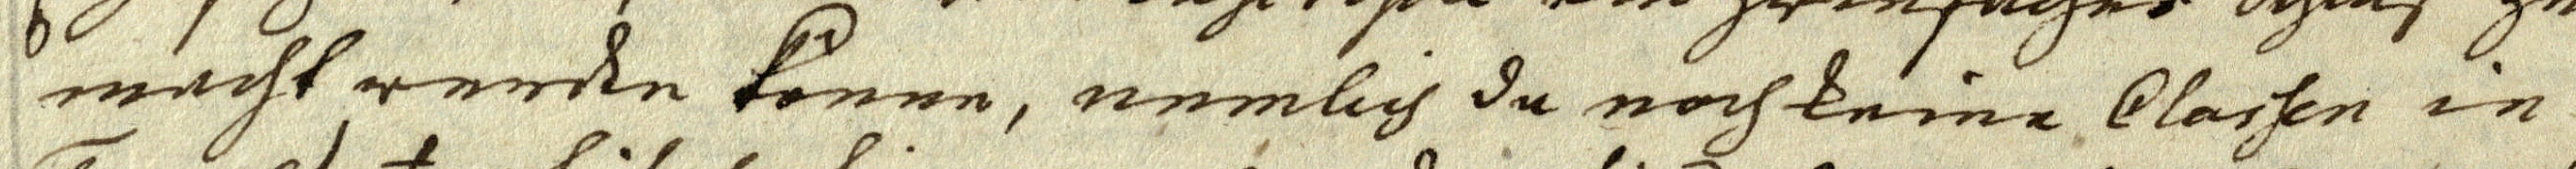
macht werden könne, nemlich da noch keine Classen in
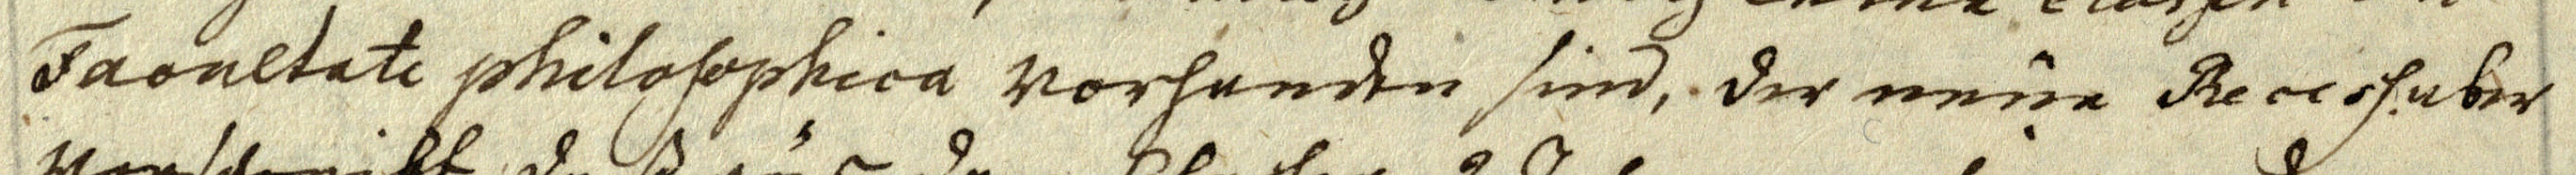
Facultate philosophica vorhanden sind, der neue Receß aber
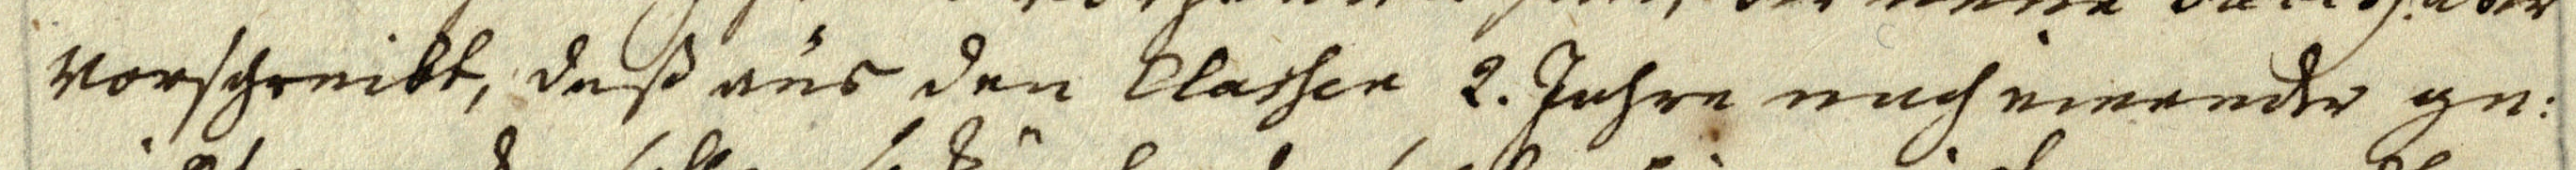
vorschreibt, daß aus den Classen 2. Jahre nacheinander ge¬
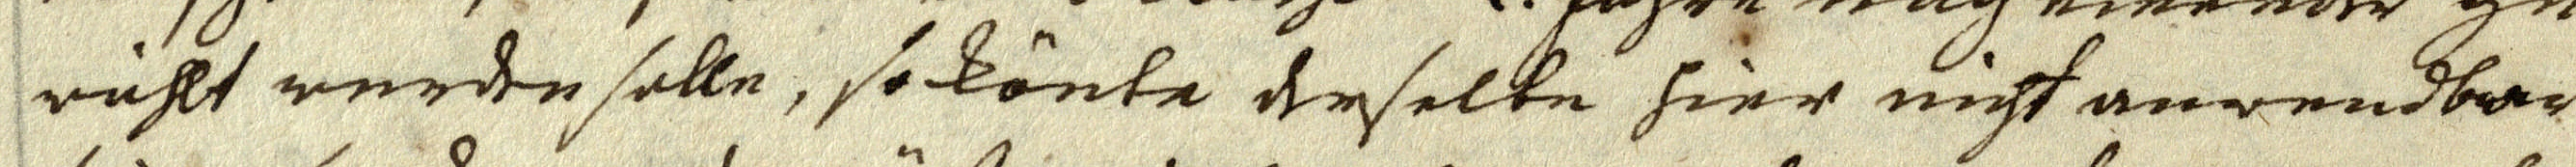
wählt werden solle, so könte derselbe hier nicht anwendbar
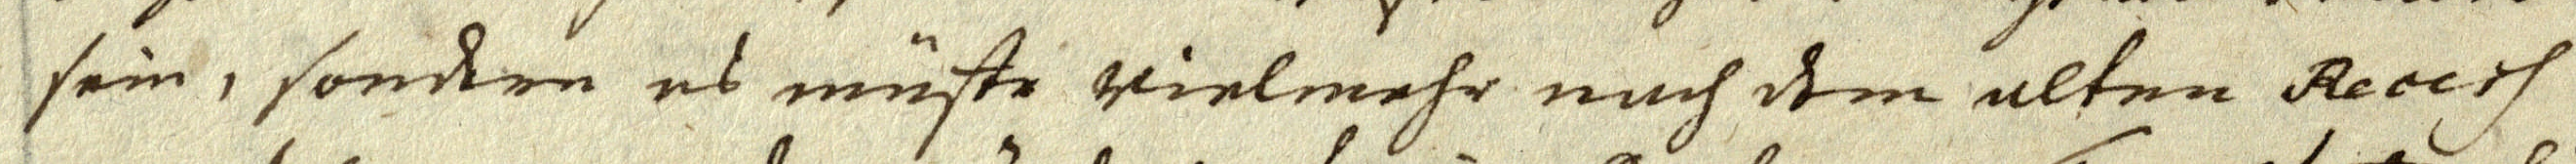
sein, sondern es müste vielmehr nach dem alten Recess
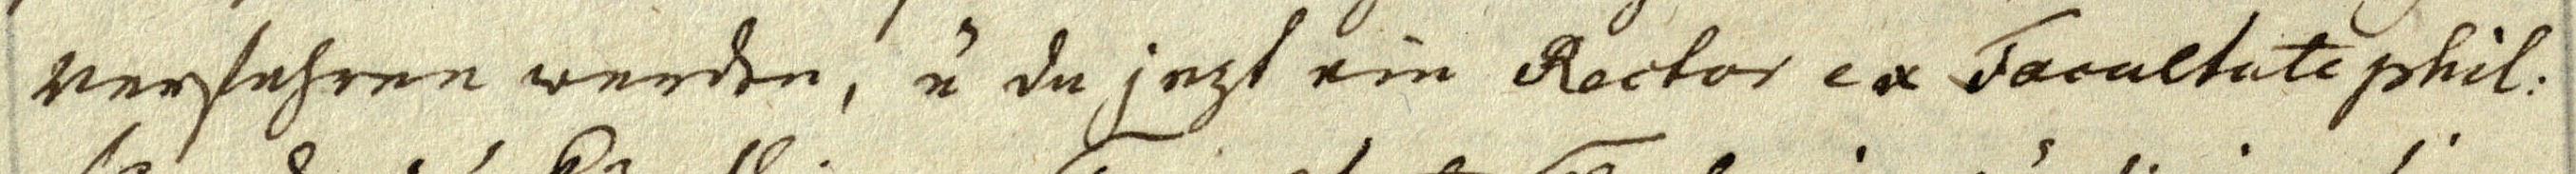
verfahren werden, u da jezt ein Rector ex Facultate phil.
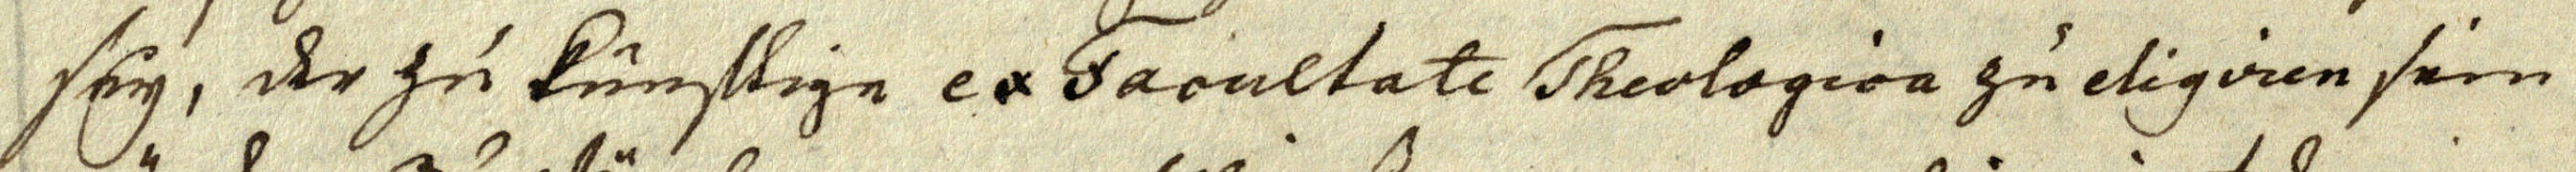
seÿ, der zu künftige ex Facultate Theologiae zu eligiren sein
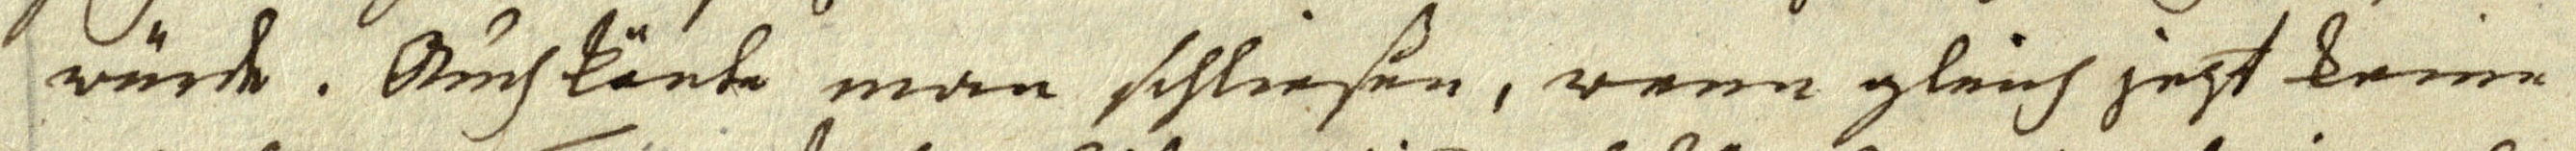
würde. Auch könte man schließen, wenn gleich jezt keine
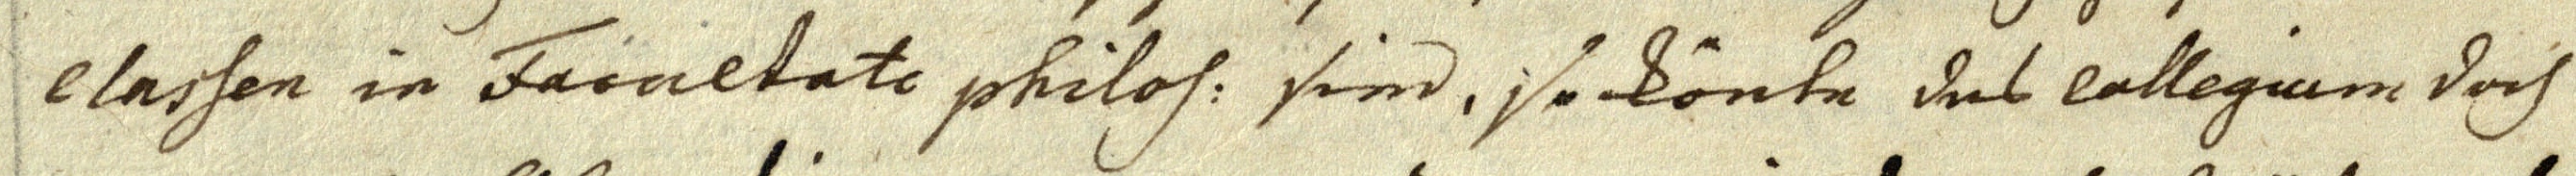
Classen in Facultate philos. sind, so könte das collegium doch
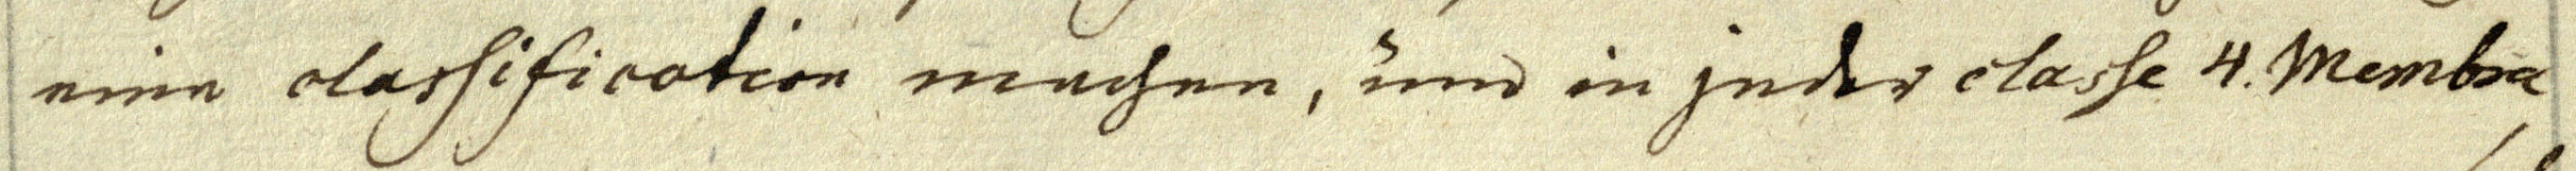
eine classification machen, und in jeder classe 4 Membra
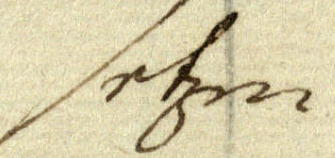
setzen
